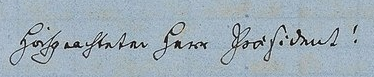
Hochgeachteter Herr Präsident!
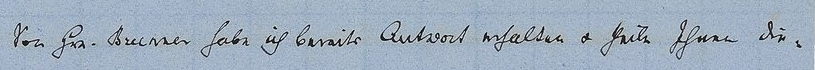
Von Hrn. Brunner habe ich bereits Antwort erhalten & theile Ihnen die-
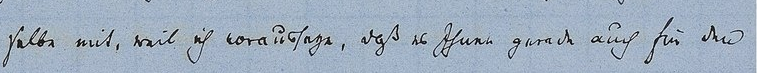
selbe mit, weil ich voraussetze, daß es Ihnen gerade auch für den
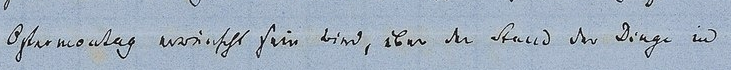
Ostermontag erwünscht sein wird, über den Stand der Dinge in
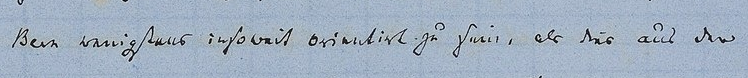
Bern wenigstens insoweit orientirt zu sein, als dies aus der
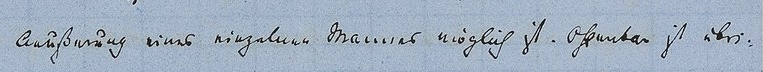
Aeußerung eines einzelnen Mannes möglich ist. Offenbar ist übri-
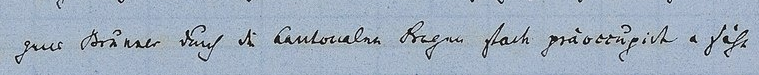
gens Brunner durch die kantonalen Fragen stark präoccupirt & sieht
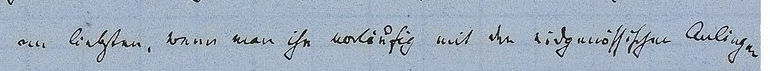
am liebsten, wenn man ihn vorläufig mit den eidgenössischen Anliegen
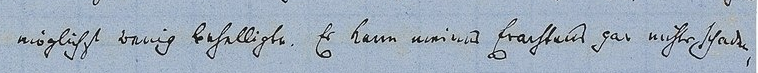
möglichst wenig behelligte. Es kann meines Erachtens gar nichts schaden,
